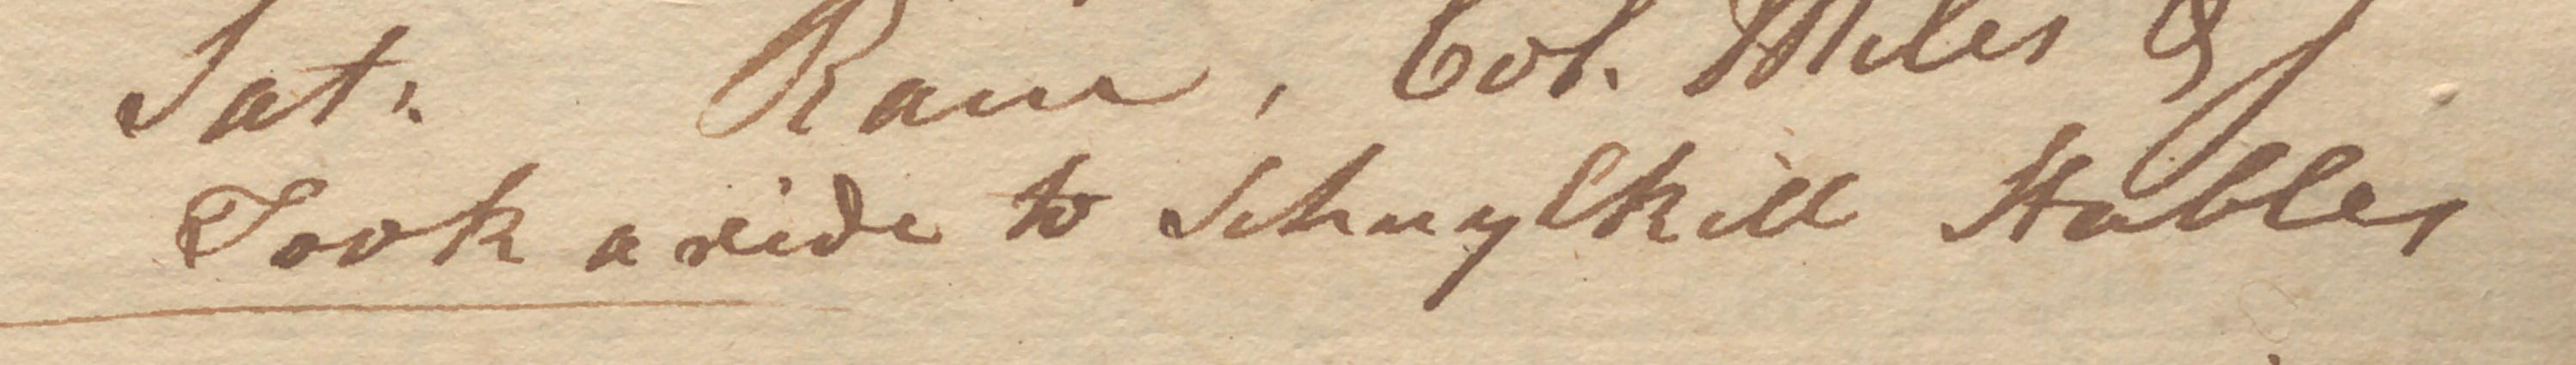Took a ride to Schuylkill Stables
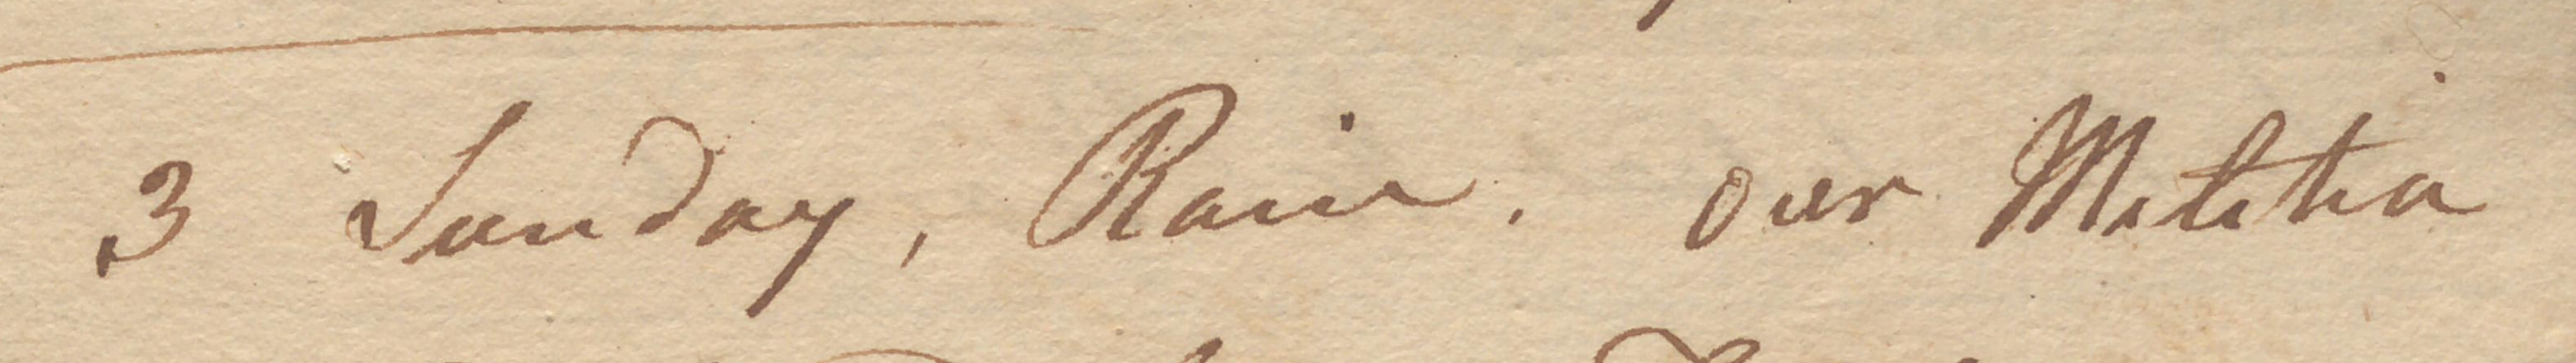3 Sunday, Rain. our Militia
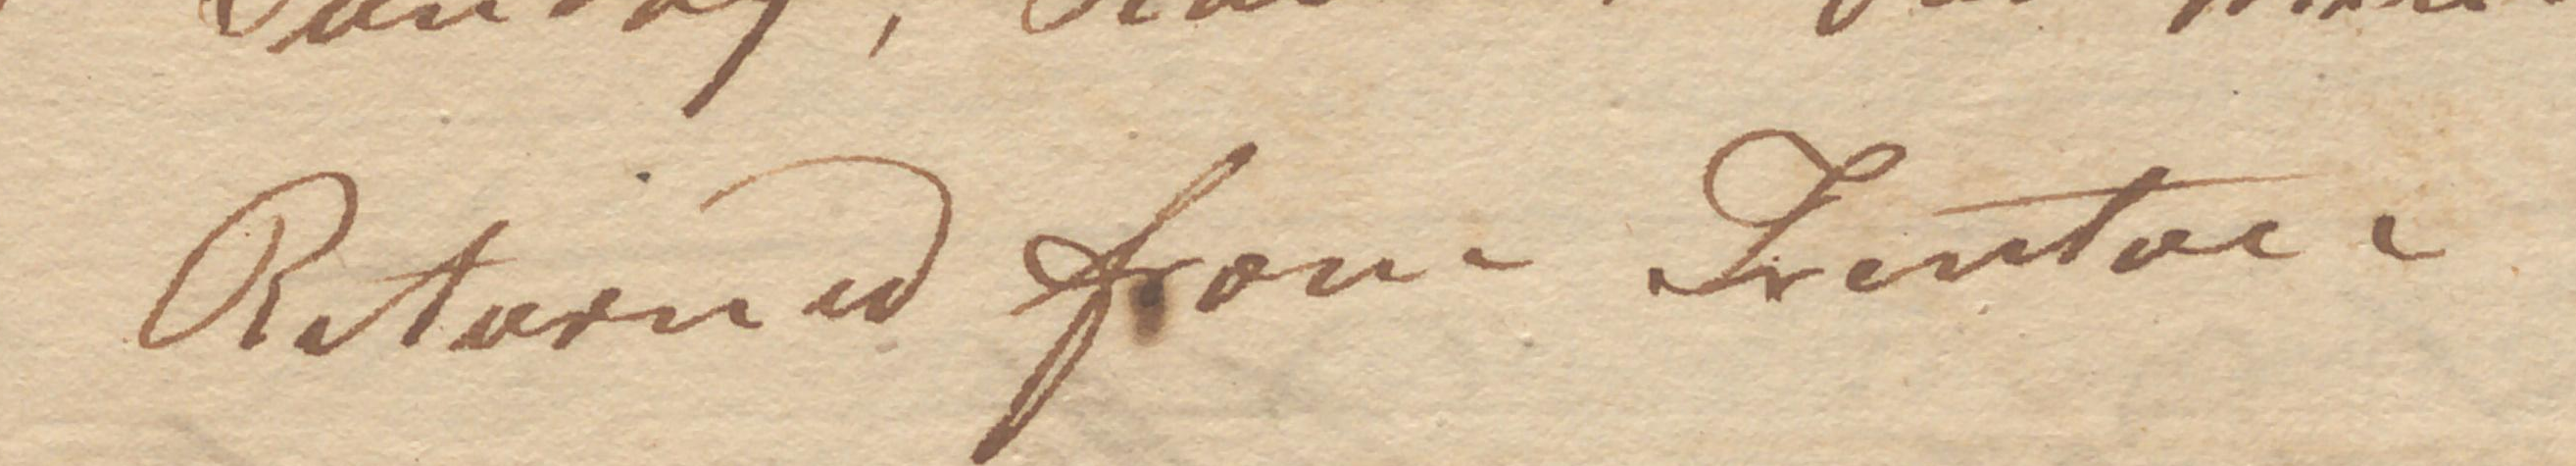Returned from Trenton
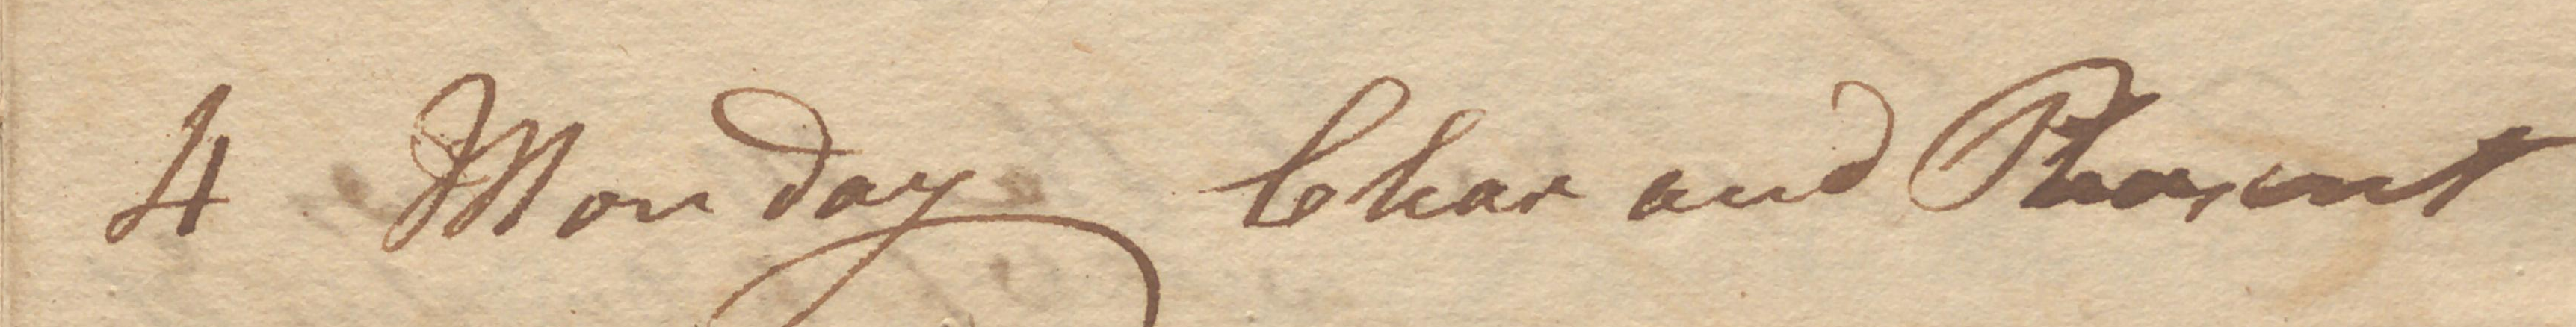4 Monday, Clear and Pleasent
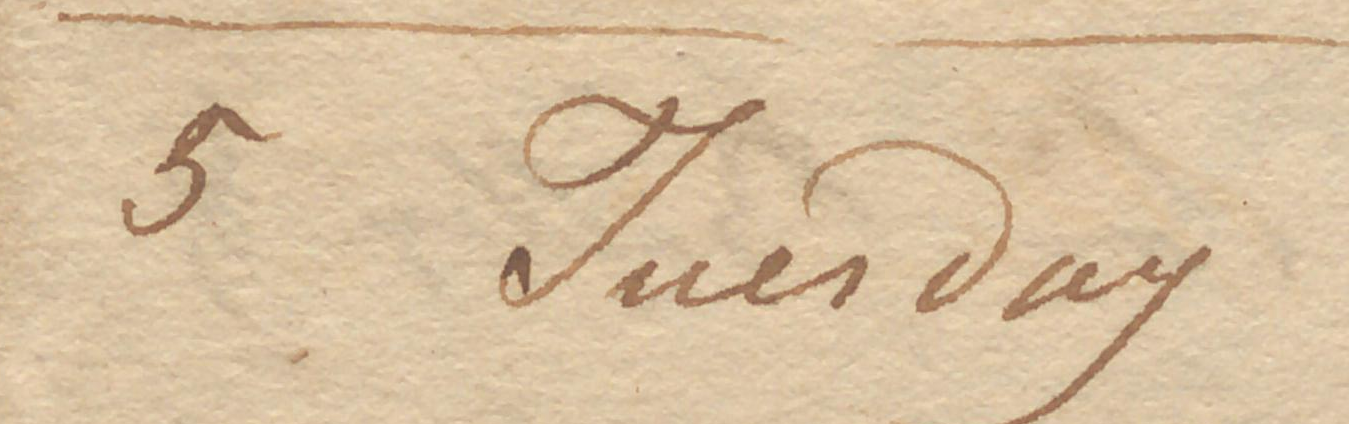5 Tuesday
